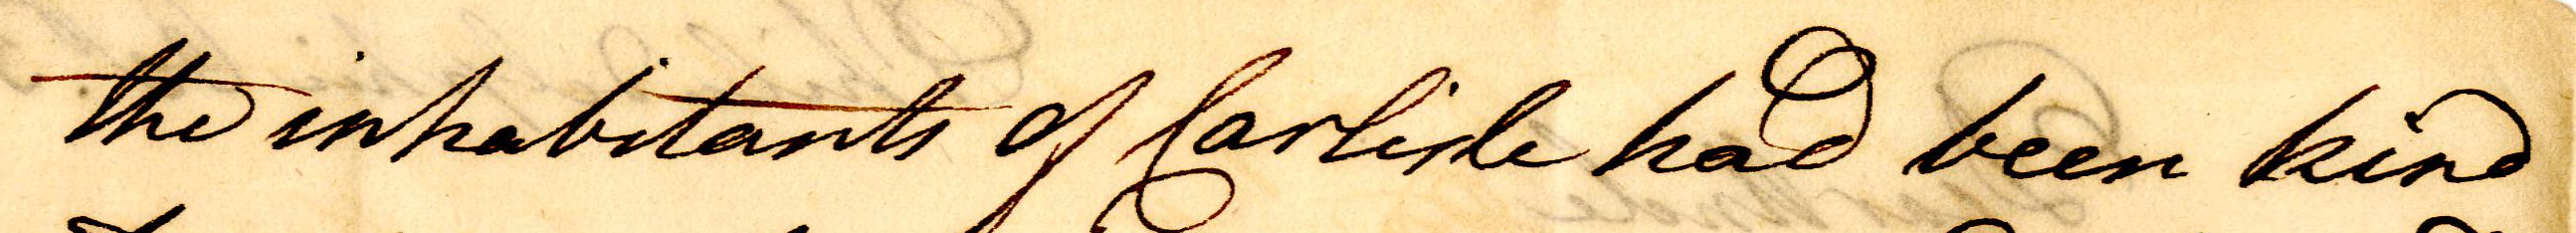the inhabitants of Carlisle had been kind
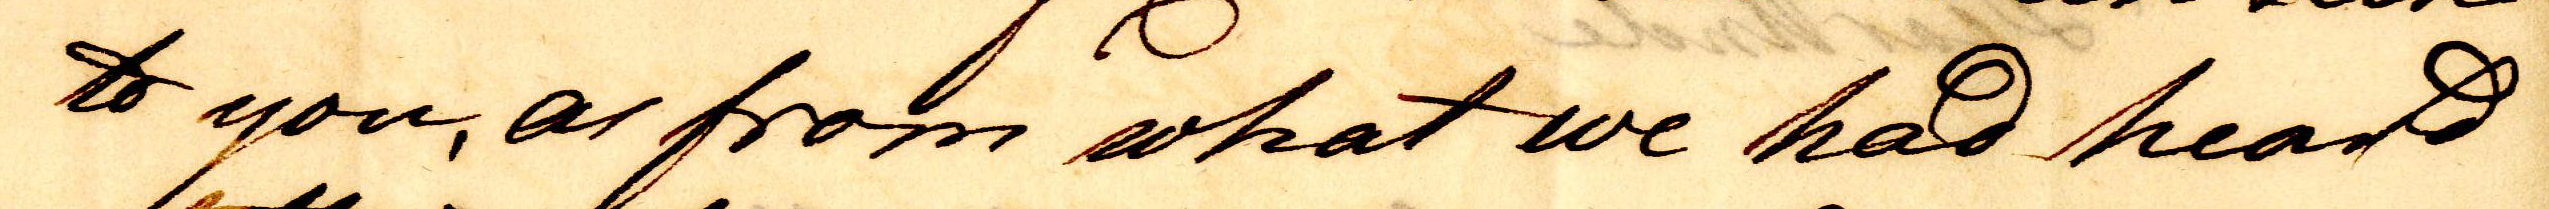to you, as from what we had heard
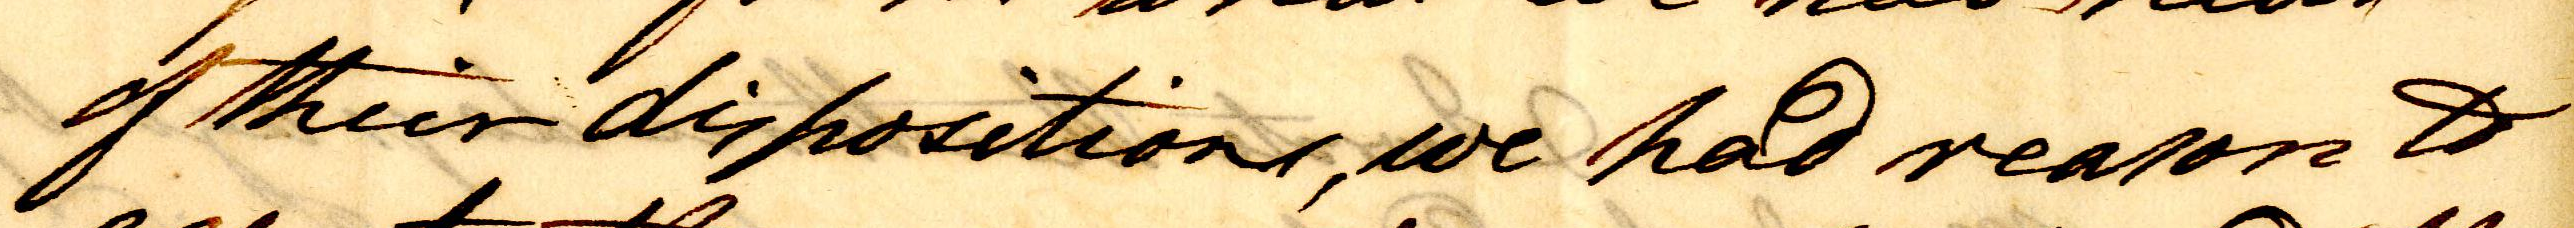of their disposition, we had reason to
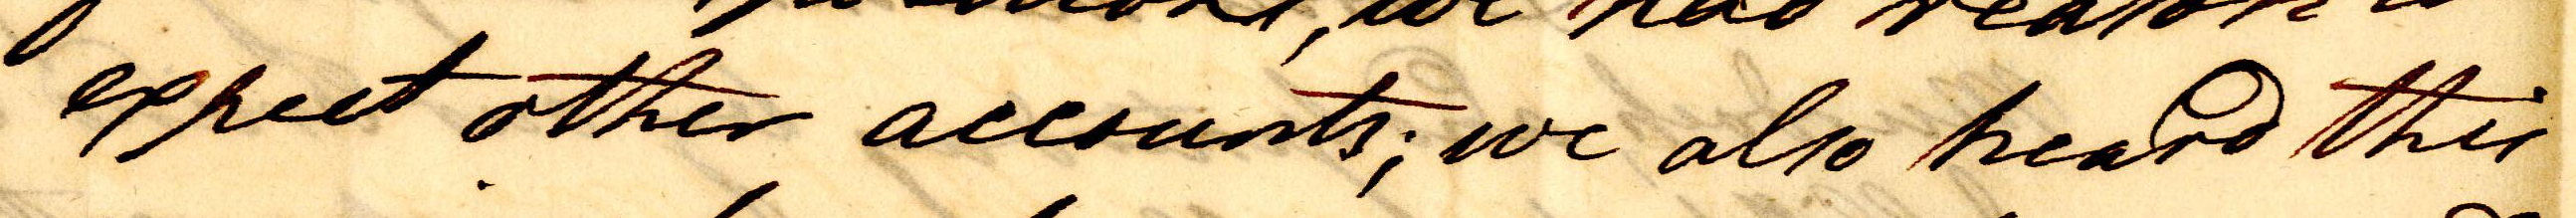expect other accounts; we also heard this
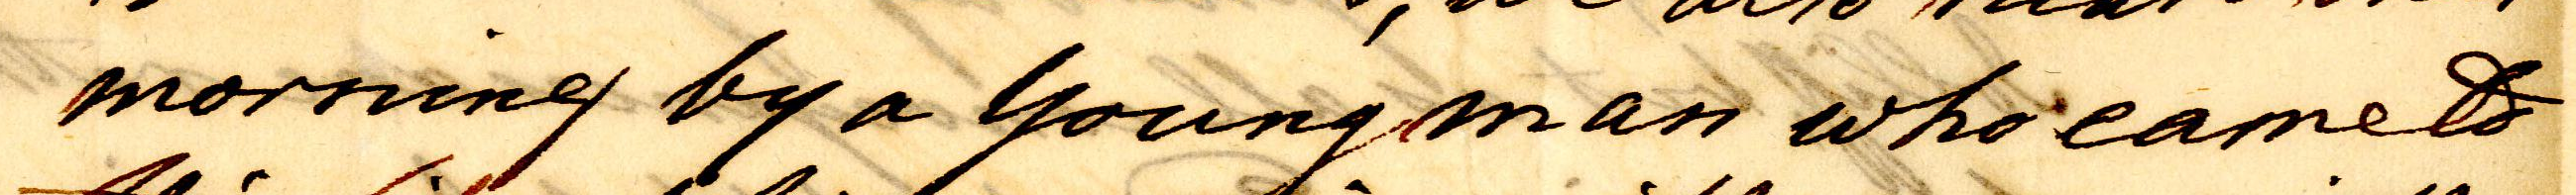morning by a Young man who came to
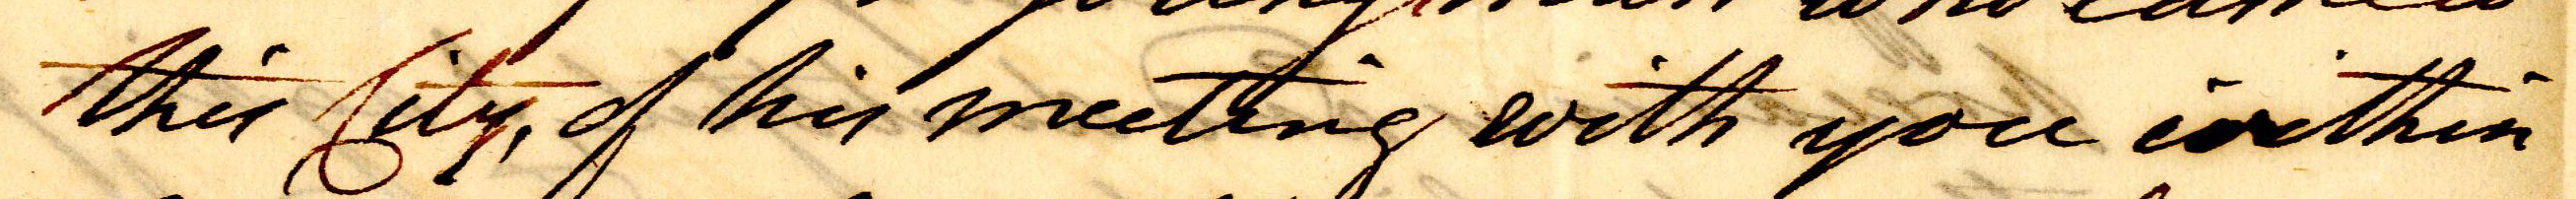this City of his meeting with you within
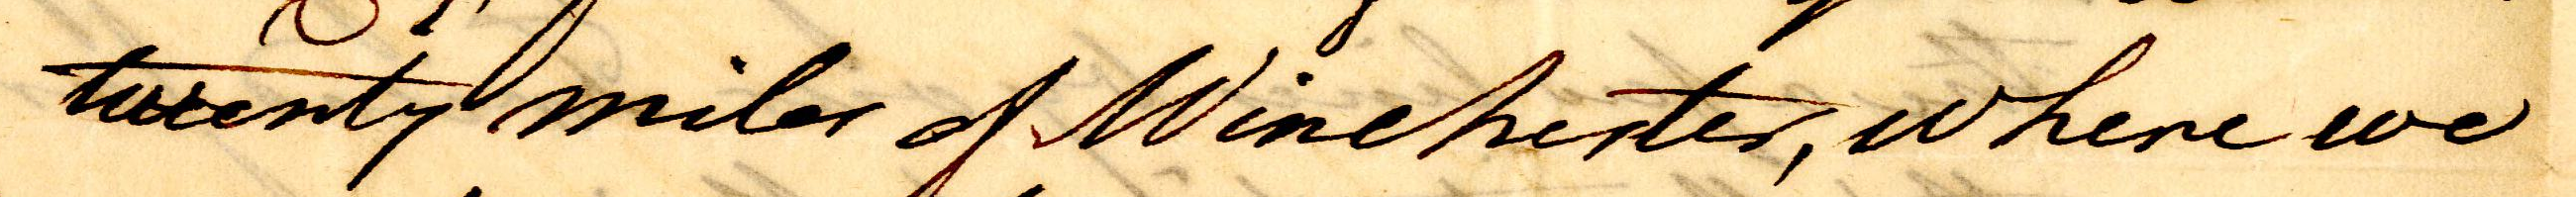twenty miles of Winchester, where we
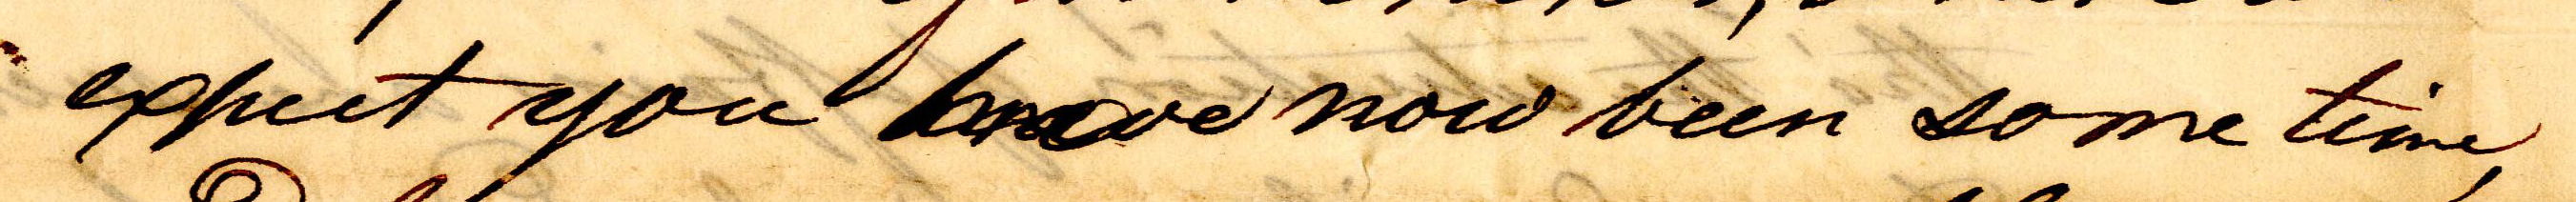expect you have now been some time,
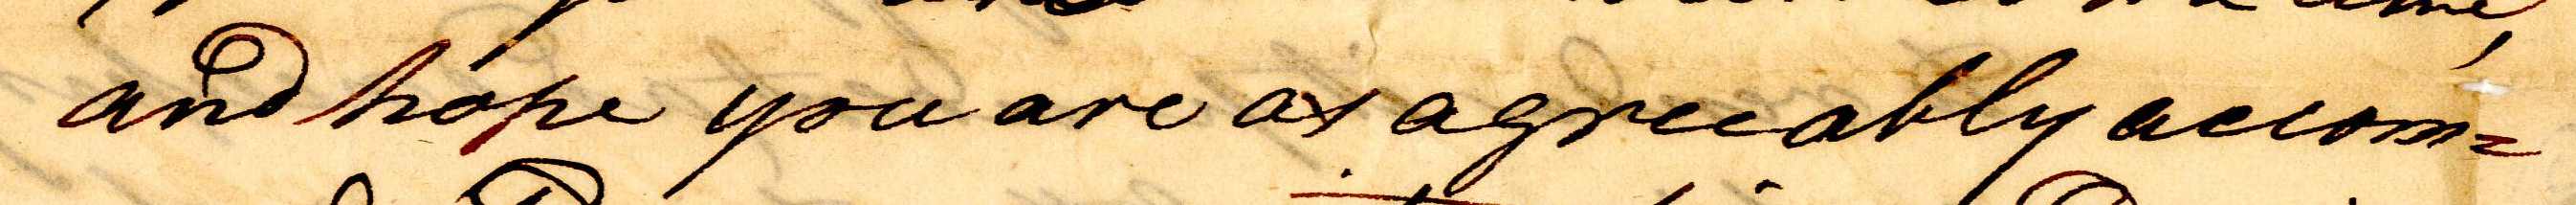and hope you are as agreeably accom-
